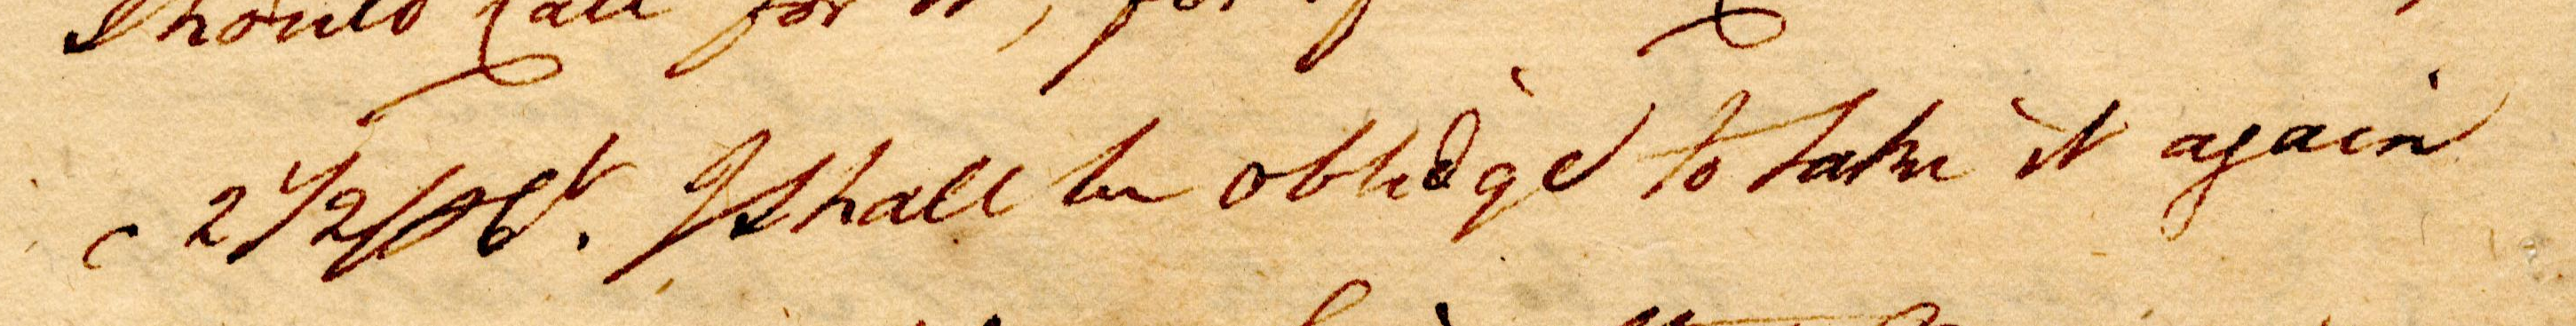@ 2s2 per 6 ^t. I shall be oblidge to take it again
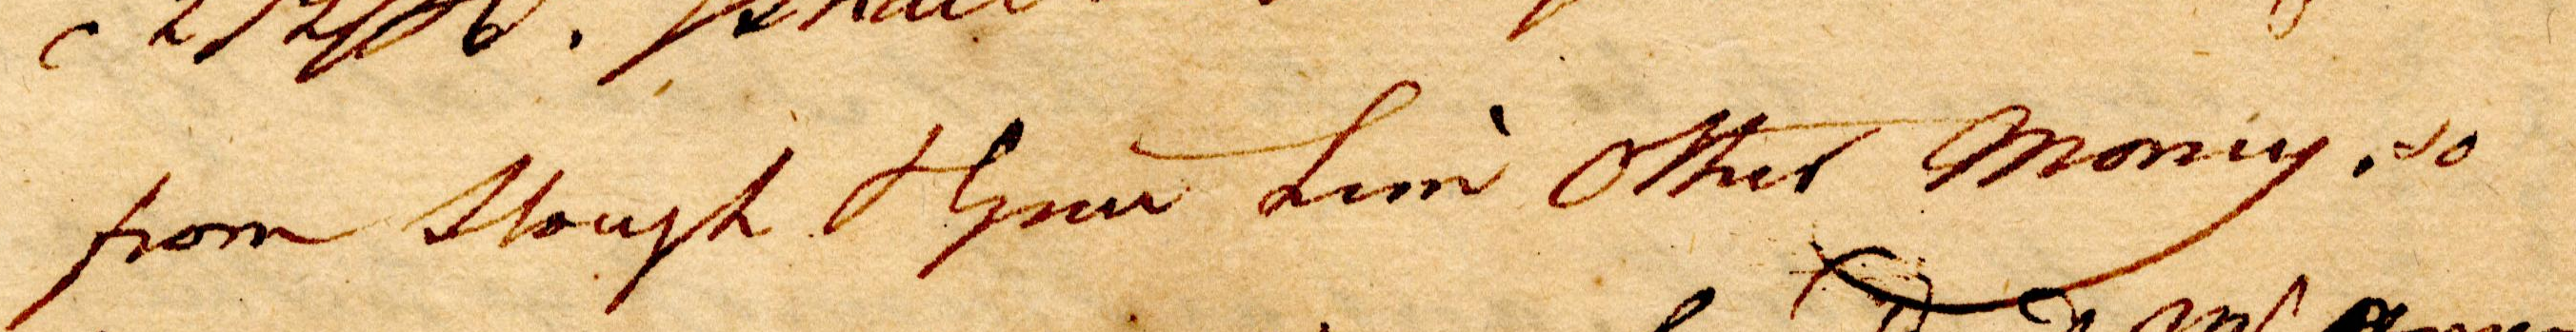from Slough & given him Other Money, so
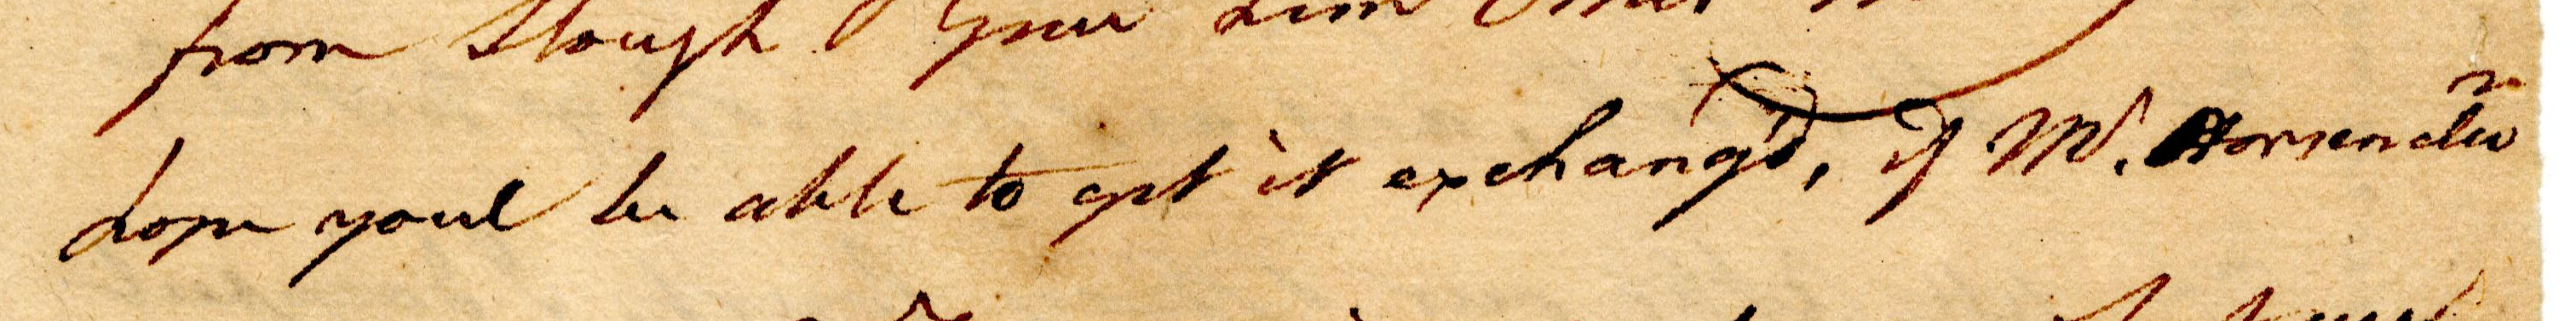hope youl be able to get it exchang'd, of M^r. Horsenclev^r
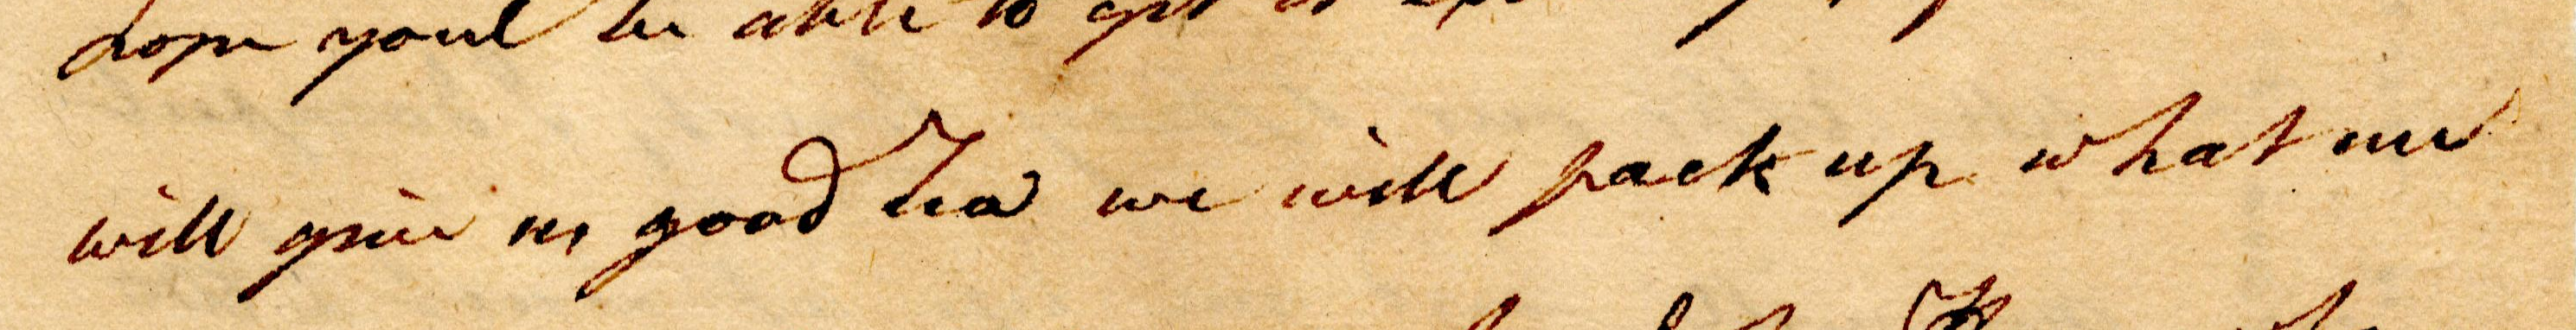will give us good Tea we will pack up what we
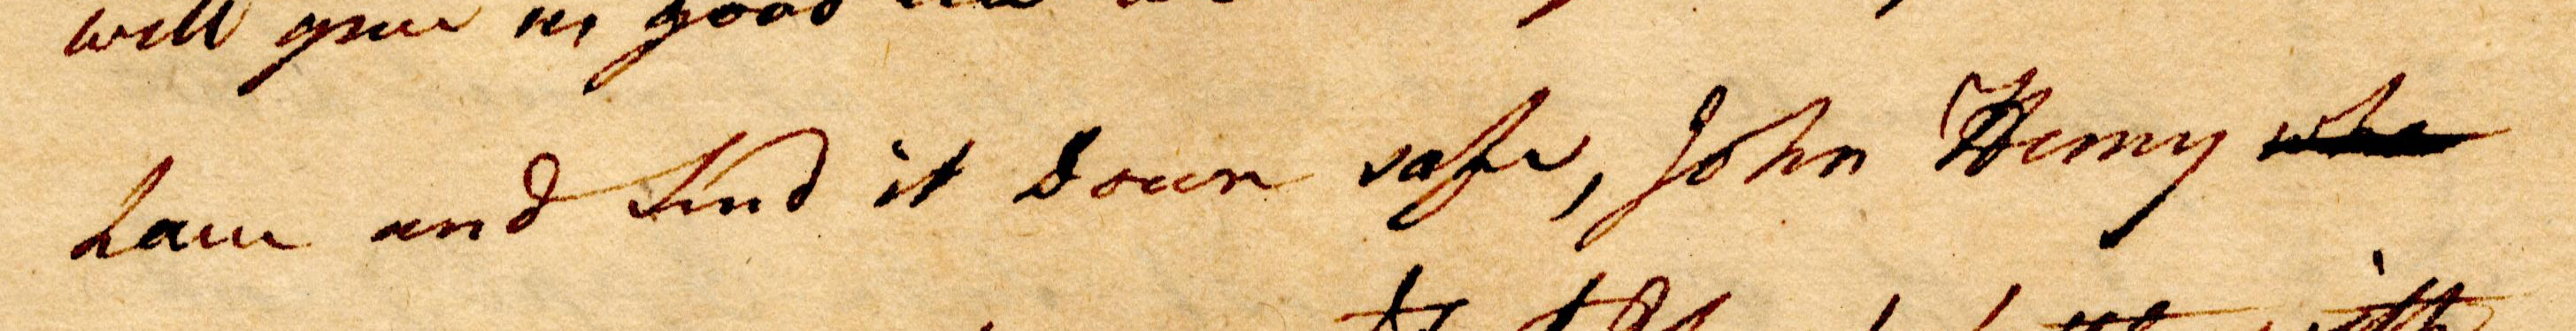have and send it Down safe, John Henry [who]
